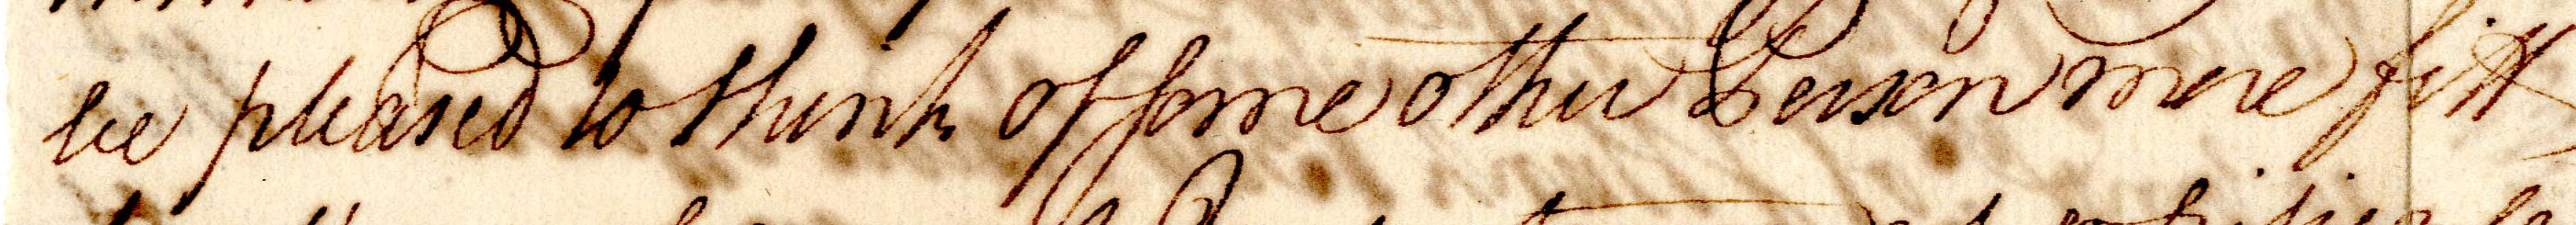be pleased to think of some other Person more fitt
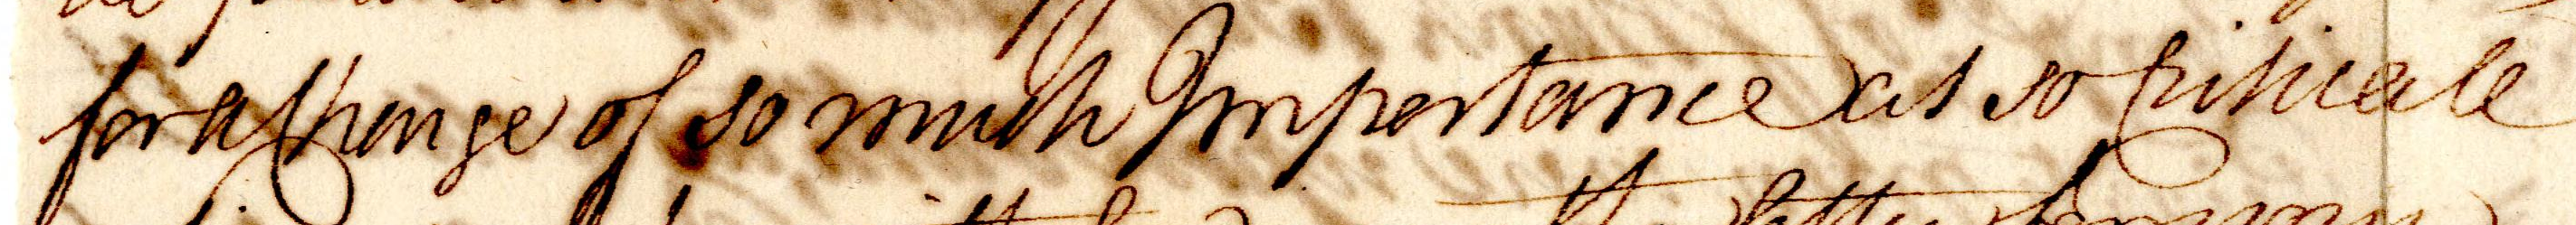for a Change of so much Importance as so Criticale
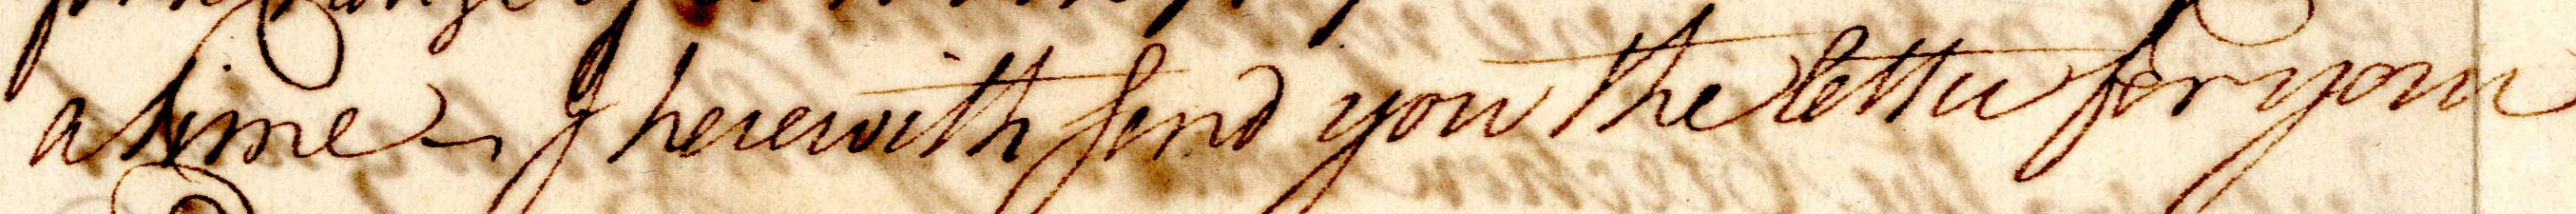a time. I herewith send you the letter for your
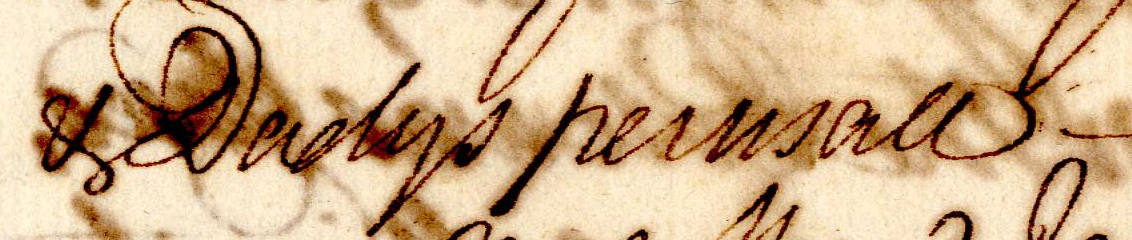& Dadys perusall.
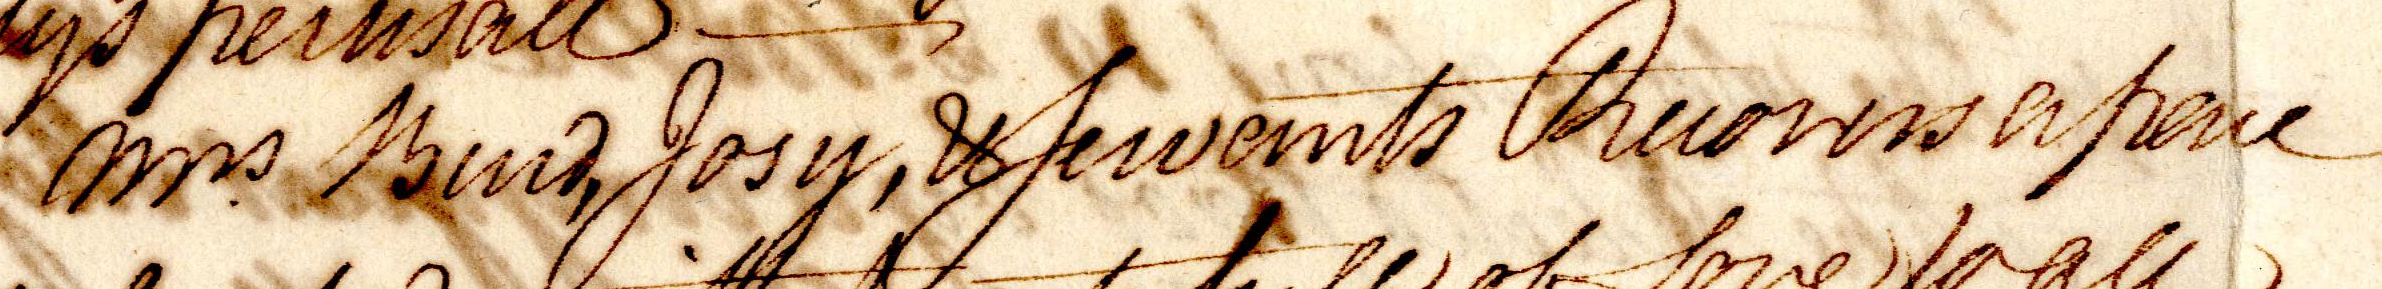M^rs Bend, Josy, & Servants Recovers apere
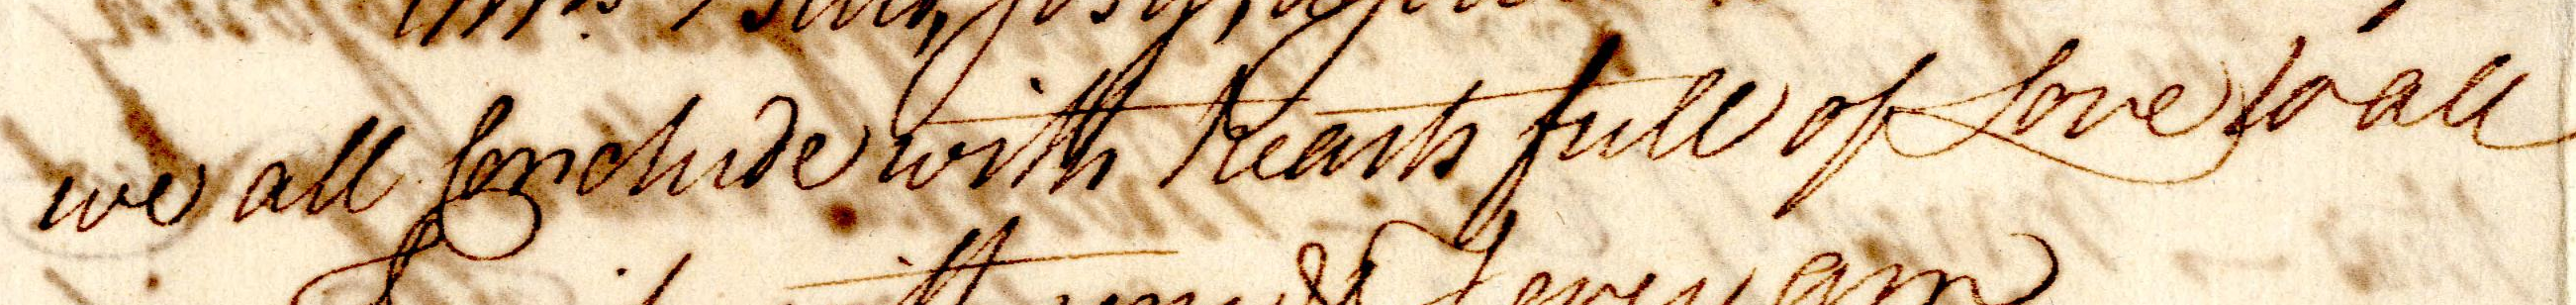we all Conclude with Hearts full of Love to all
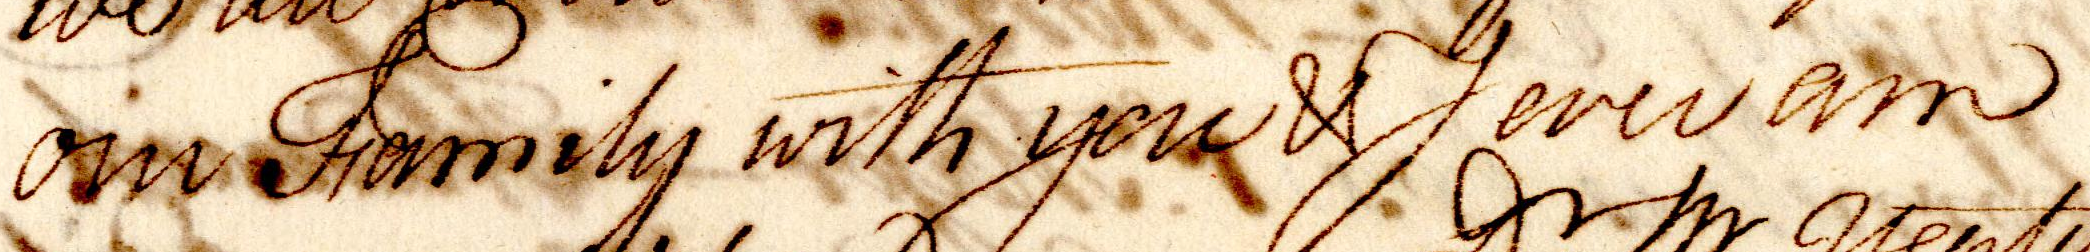our Family with you & I ever am
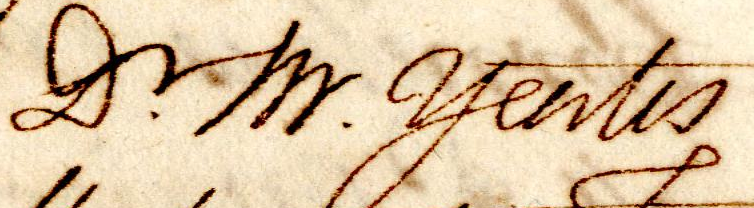D^r. M^r. Yeates
